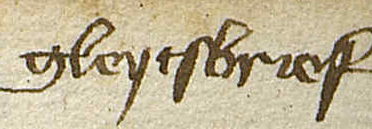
gleytſbrief
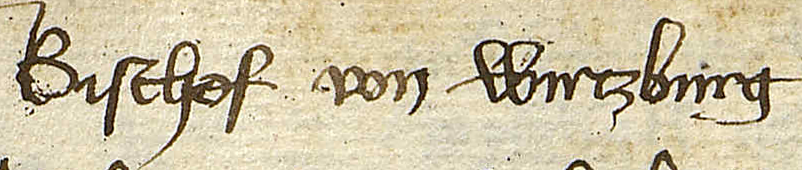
Biſchof von Wircʒburg
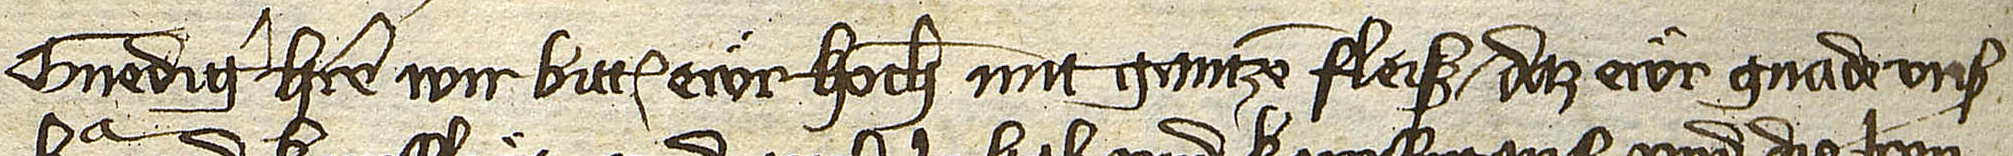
Gnedig* h*re wir bitt* ewr hoch* mit gancʒe* fleiſʒ / daʒ ewr gnade vnſ*
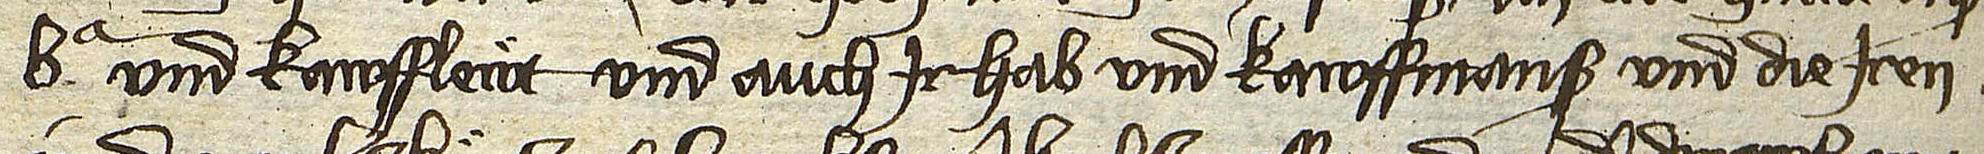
b* vnd kawfflewt vnd auch Ir hab vnd kawffmanſ* vnd die Iren
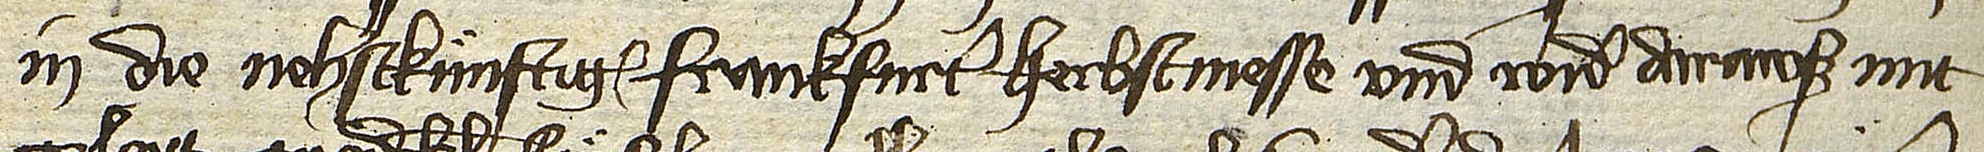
in die nehſtkünftig* frankfurt* herbſtmeſſe vnd wid* darawſʒ mit
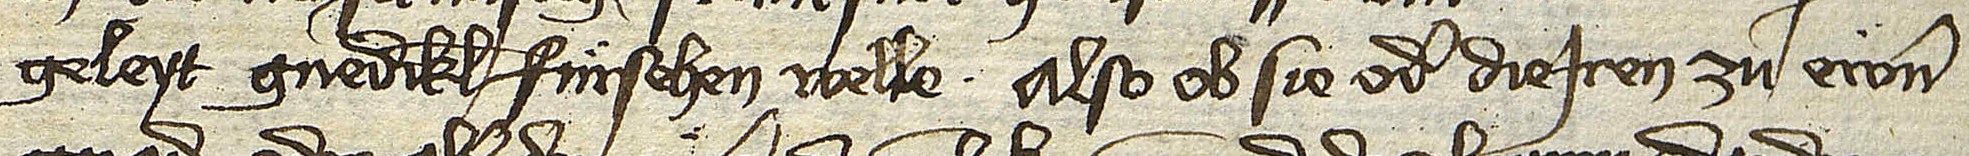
geleyt gnedikl* fürſehen welle . Alſo ob ſie od* die Iren ʒu ew*n
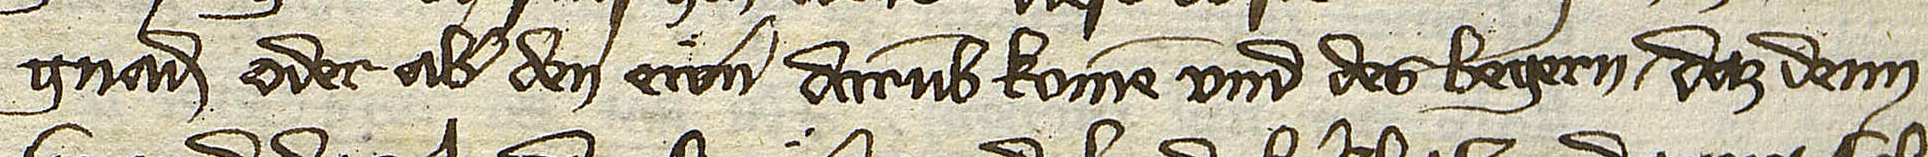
gnad* oder ab* den ew*n daru*b kome* vnd des begern / daʒ denn
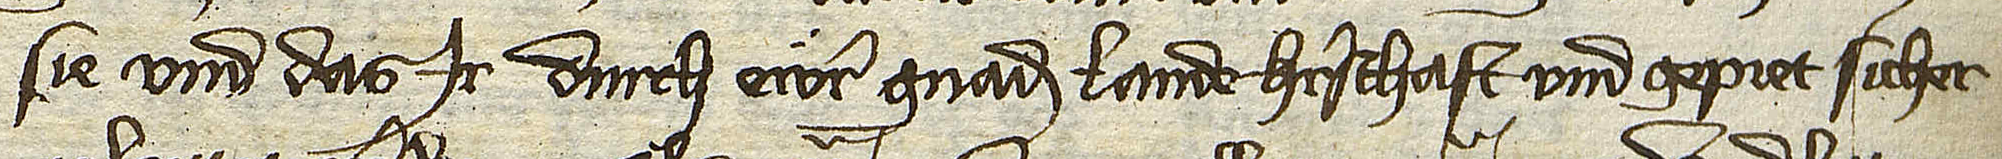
ſie vnd das Ir durch ew*r gnad* lande h*rſchaft vnd gepiet ſicher
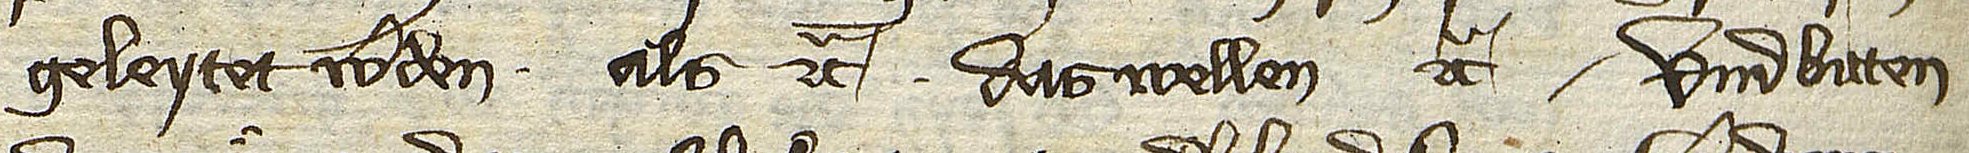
geleytet w*den . als ec* . das wellen ec* / Vnd bitten
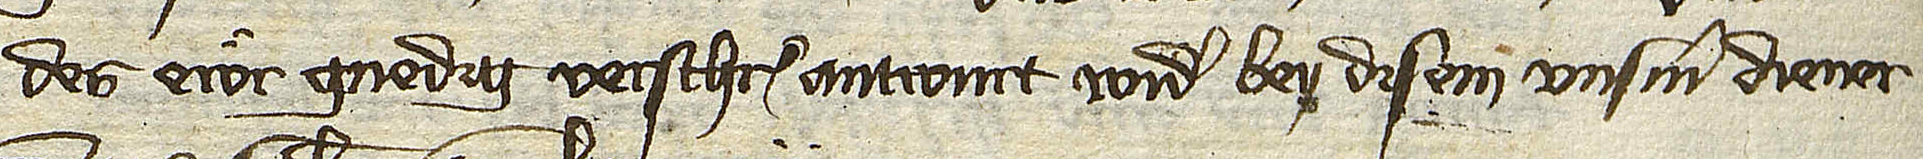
des ewr gnedig verſchr* antwurt wid* bey diſem vnſ*m diener
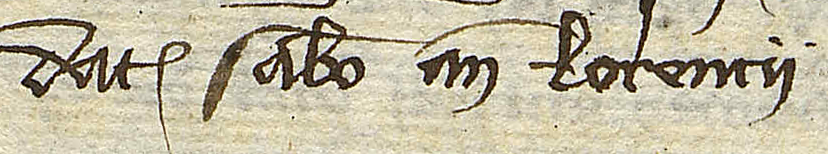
Dat* ſabo* an* Lorencii
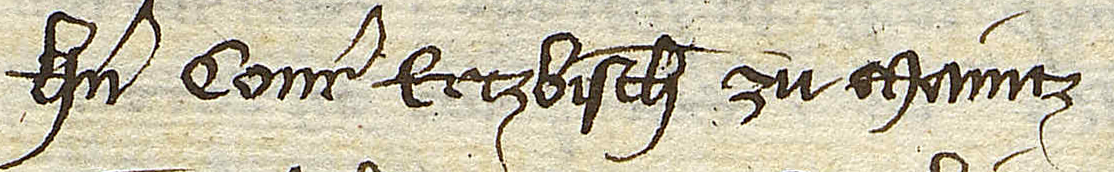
H*n Conr* Ercʒbiſch* ʒu Maincʒ
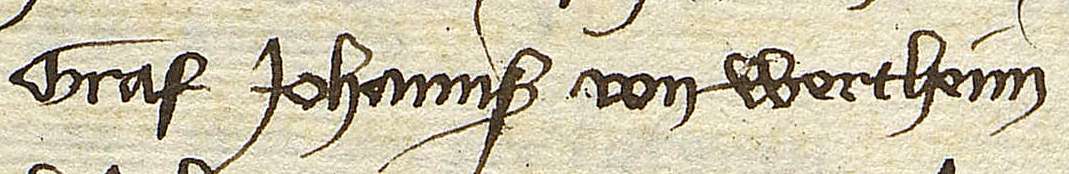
Graf Iohannſ* von Wertheim
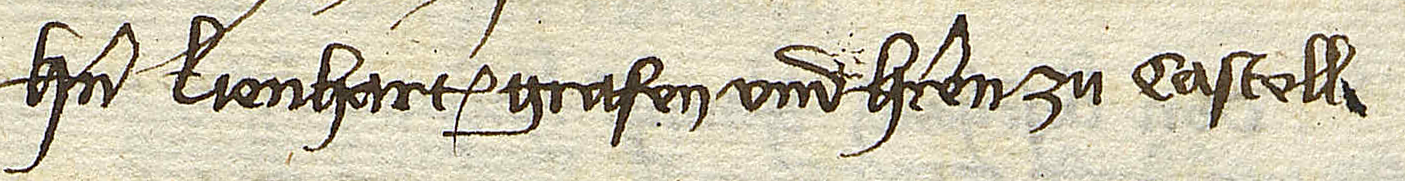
H*n Lienhart* grafen vnd h*ren ʒu Caſtell
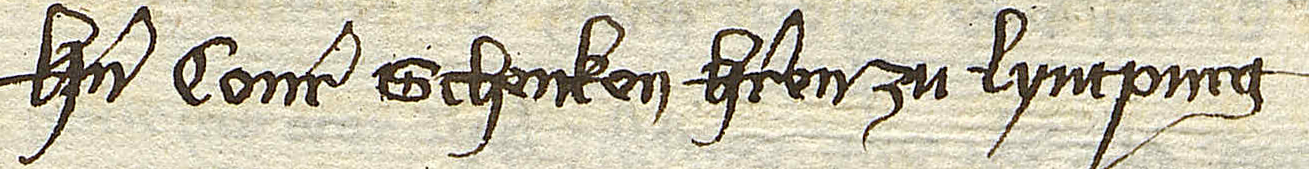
H*n Conr* Schenken h*ren ʒu Lyntpurg
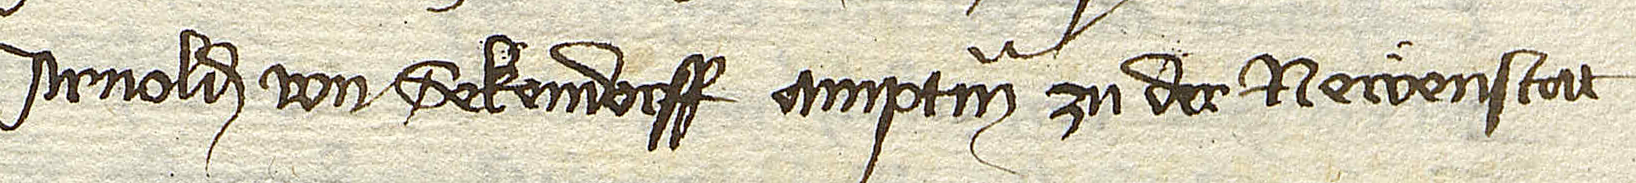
Arnold* von Sekendorff amptm* ʒu der Newenſtat
